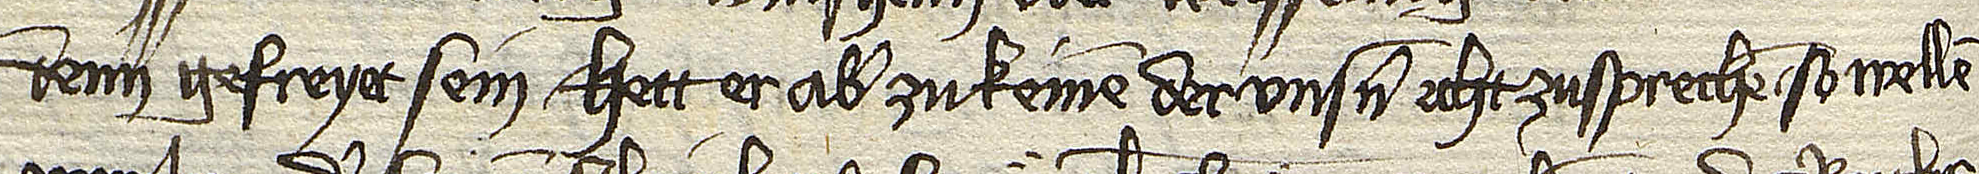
denn gefreyet ſein / hett er ab* ʒu keine* der vnſn* icht ʒuſpreche* / ſo welle*
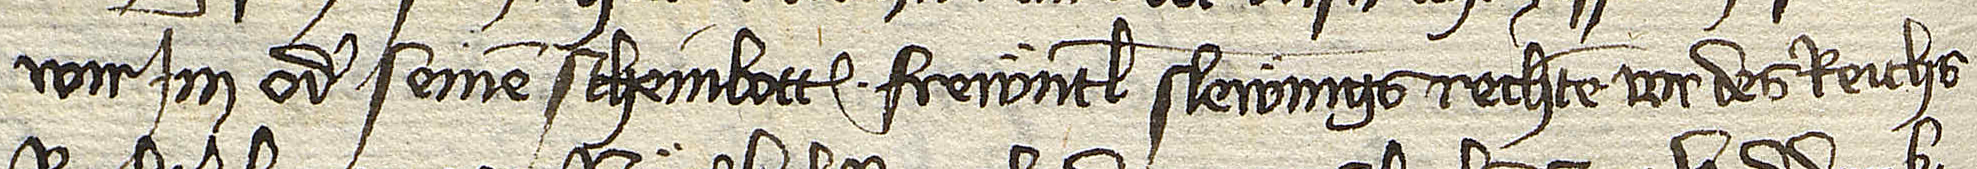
wir Im od* ſeine* ſcheinbott* . freẅntl* ſleẅnigs rechte* vor des Reichs
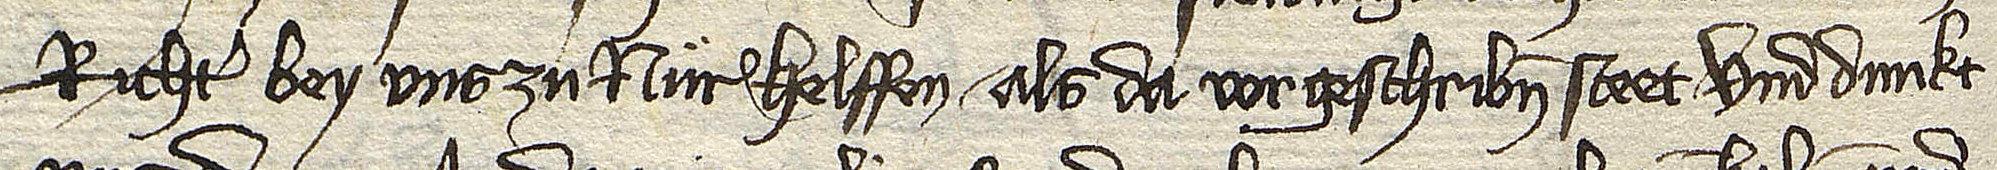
Richt* bey vns ʒu Nür* helffen / als da vor geſchribn* ſteet / Vnd dunkt
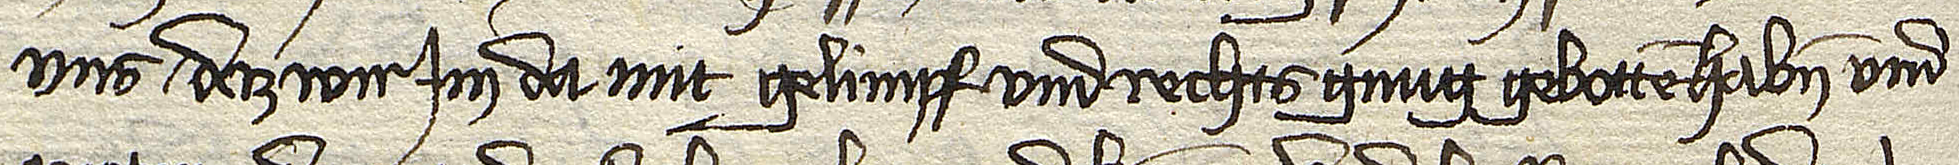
vns / daʒ wir Im da mit gelimpf vnd rechts gnug gebotte* habn* vnd
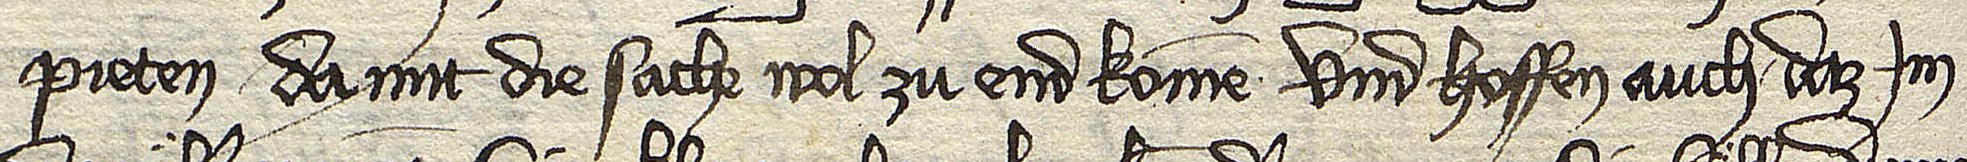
pieten / da mit die ſache wol ʒu end kome* Vnd hoffen auch / daʒ Im
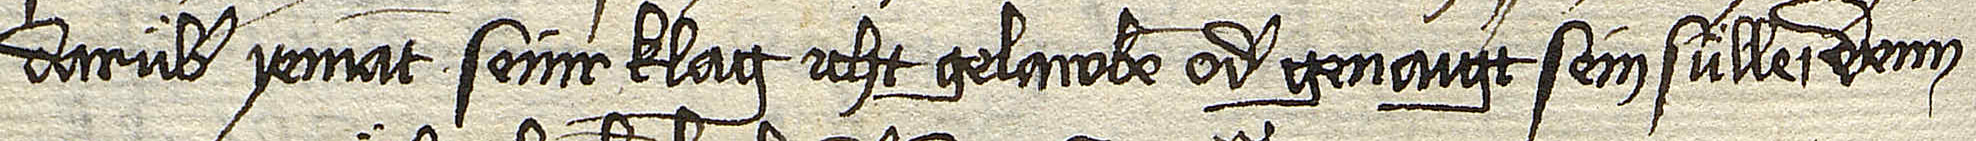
darüb* yema*t ſeinr klag icht gelawbe* od* genaigt ſein ſülle / Denn
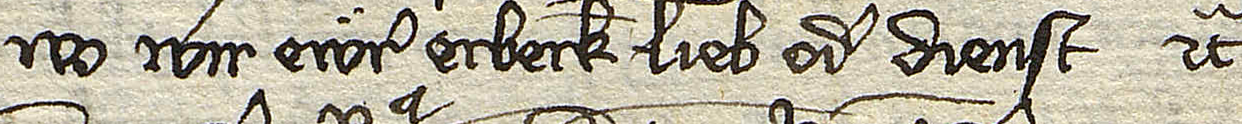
wo wir eẅr* erberk* lieb od* dienſt ec*
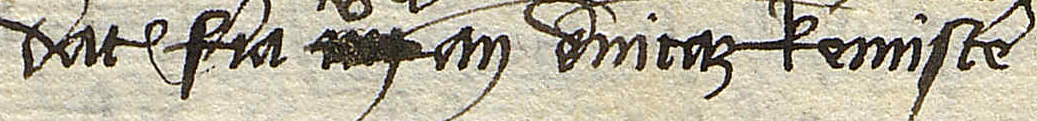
Dat* fi*a iiii* an* dnica* Rem*iſce*
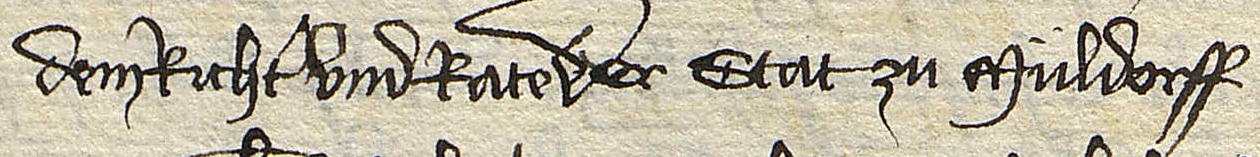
dem Richt* vnd Rate Der Stat ʒu Müldorff
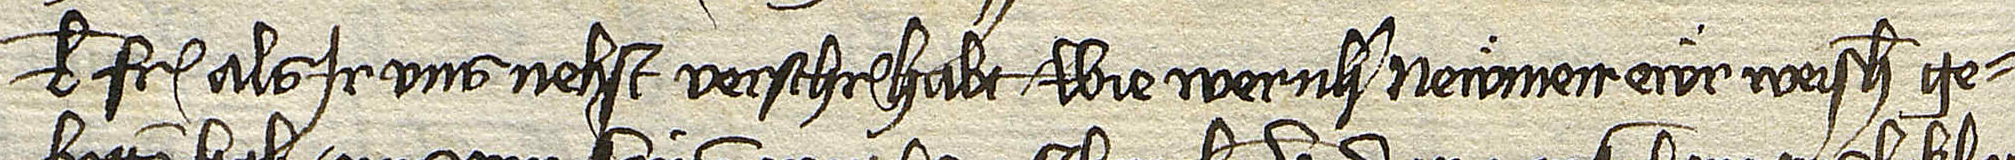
L* fr* als Ir vns nehſt verſchr* habt / wie wernh* Neẅmeir eẅr weiſh* ge =
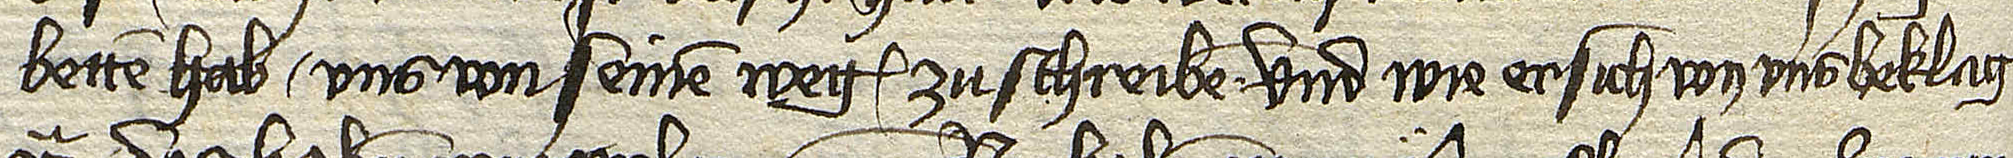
bette* hab / vns von ſeine* weg* ʒu ſchreibe* . vnd wie er ſich von vns beklag
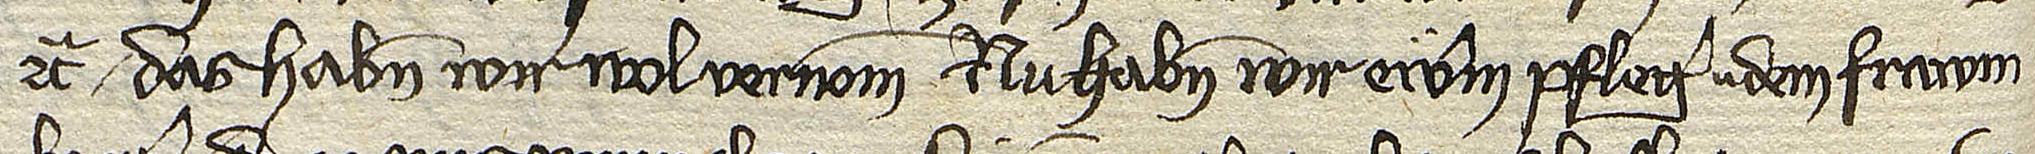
ec* / das habn* wir wol vernom* Nu habn* wir eẅ*m pfleg* ~ dem frawm
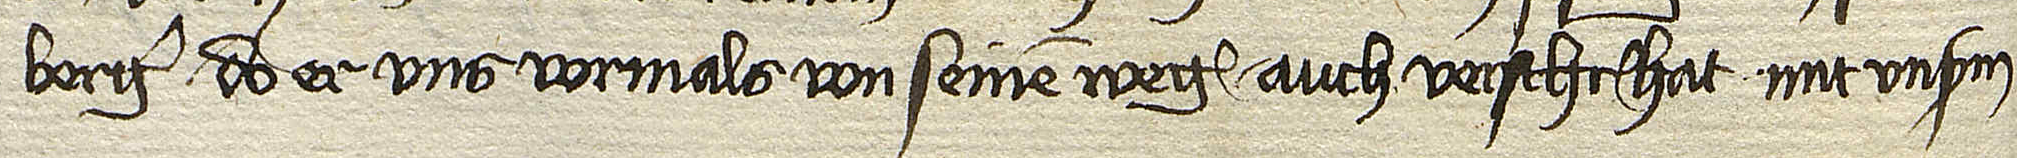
berg* / do er vns vormals von ſeine* weg* / auch verſchr* hat mit vnſ*m
